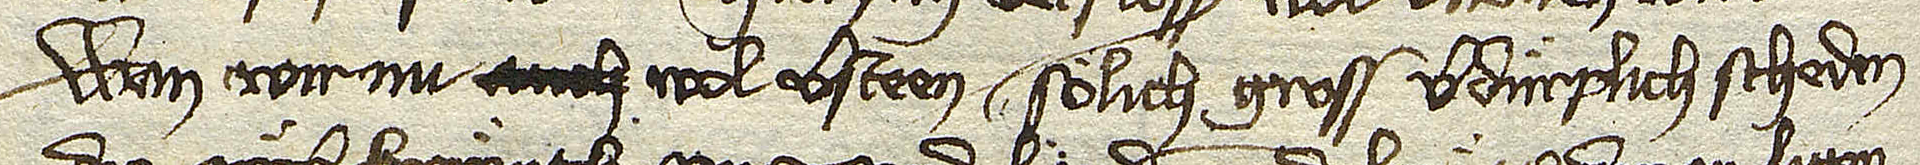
Wan wir nu auch wol v*ſteen / ſölich groſſ v*dürplich ſcheden
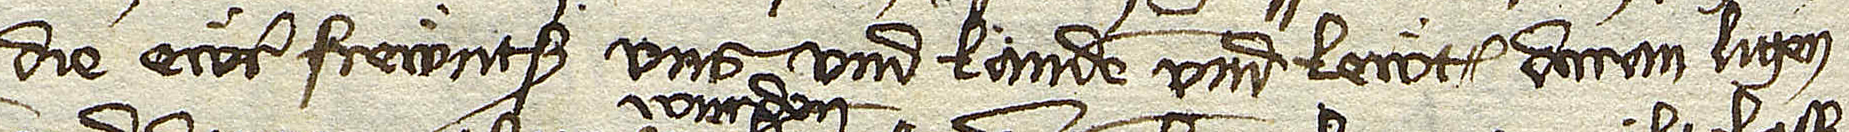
die ewr* frewntſ* vns vnd land* vnd lewt* daran ligen
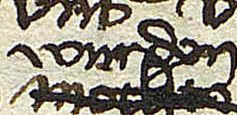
wurden
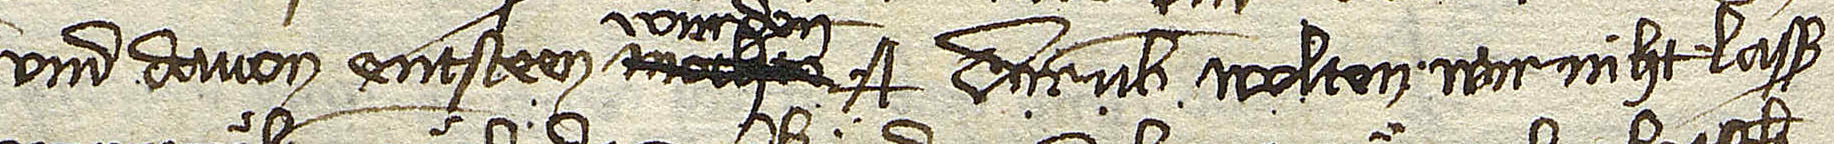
vnd dauon entſteen mochte* Daru*b wolten wir niht laſſ*
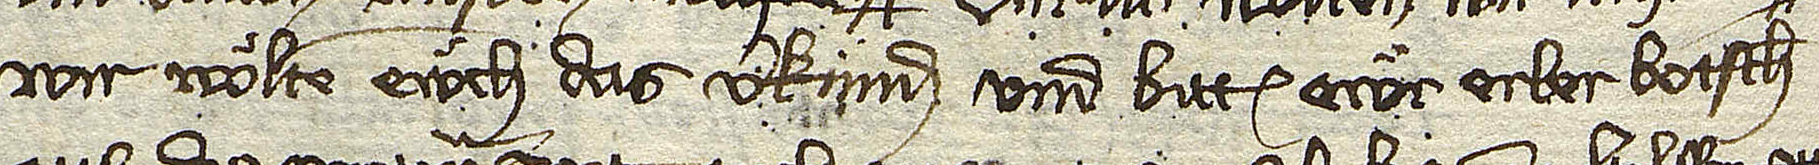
wir wölte* ewch das v*künd* vnd bitt* ewr erber botſch*
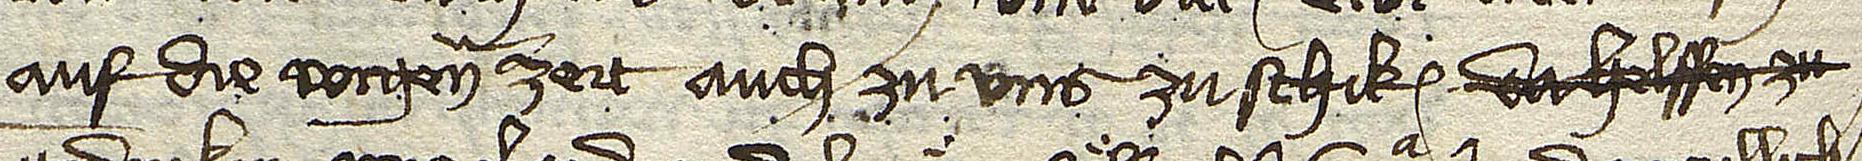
auf die vorgen* ʒeit auch ʒu vns ʒu ſchik* da helffen ʒu
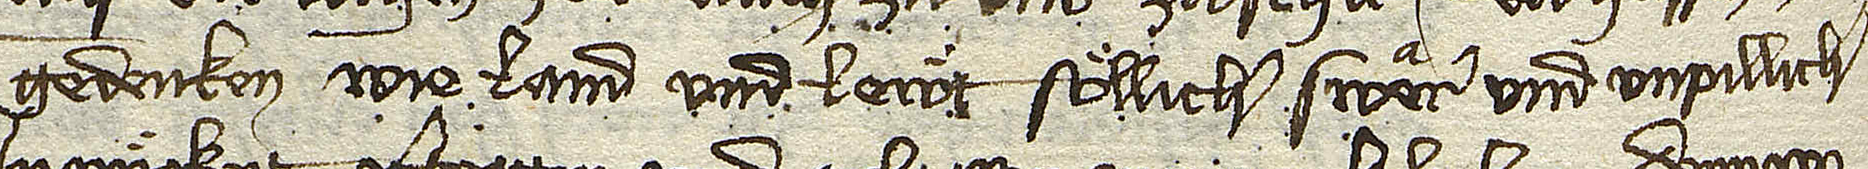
gedenken wie land vnd lewt ſöllich* ſwër* vnd vnpillich*
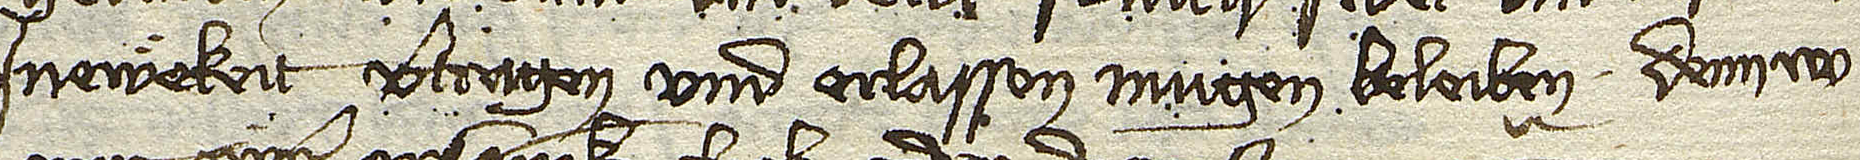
newekeit v*tragen vnd erlaſſen mugen beleiben . Denn wo
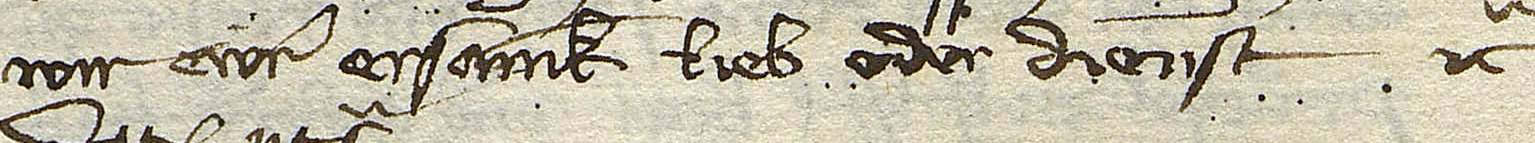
wir ewr* erſamk* lieb oder dienſt ec*
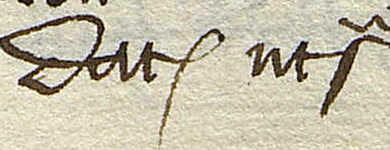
Dat* ut ſ*
